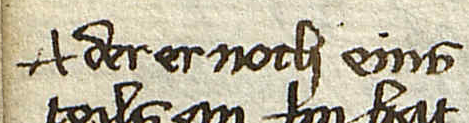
der er noch eins
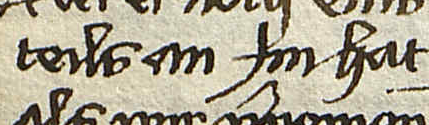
teils an Im hat
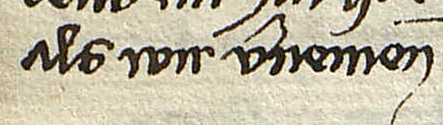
als wir v*nemen
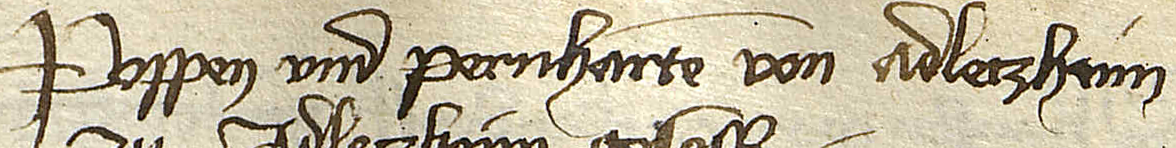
Pappen vnd Pernharte* von adlecʒheim
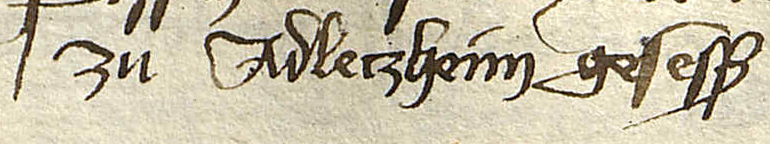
ʒu Adlecʒheim geſeſſ*
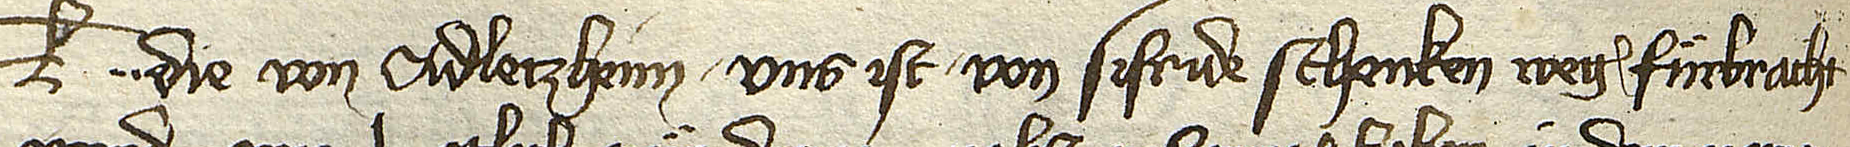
L* ~ die von Adlecʒheim / vns iſt / von ſifride ſchenken weg* fürbracht
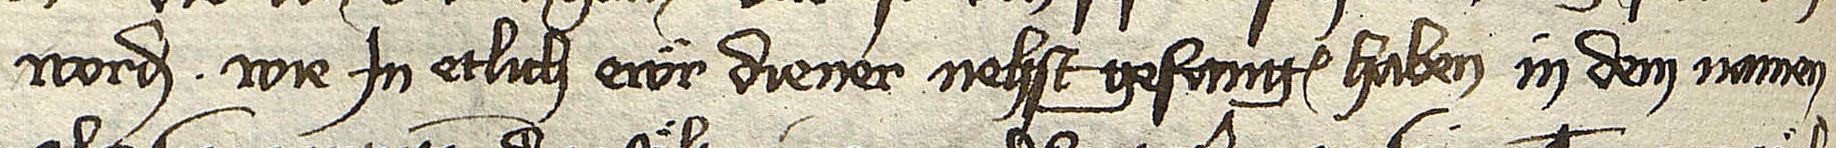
word* . wie In etlich ewr diener nehſt gefang* haben in dem namen
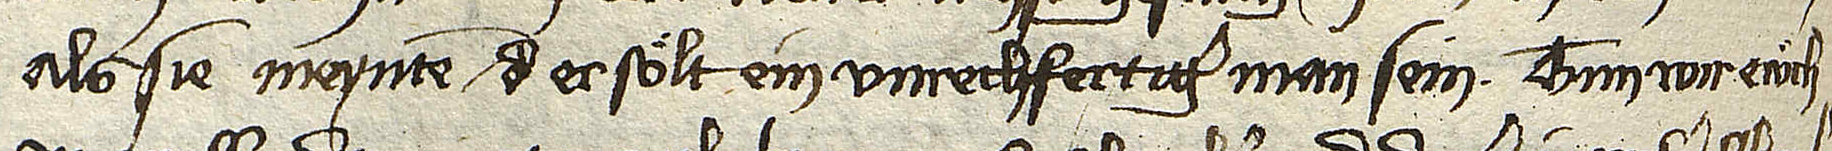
als ſie meynte* / d er ſölt ein vnrechfertig* man ſein . Tun wir ewch
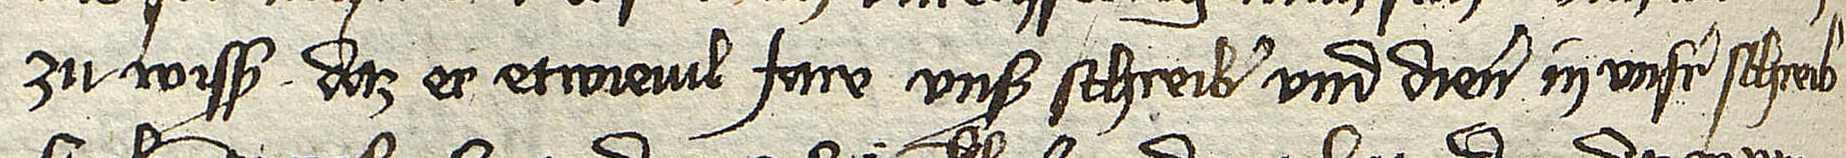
ʒu wiſſ* . daʒ er etwieuil Iare vnſ* ſchreib* vnd dien* in vnſ*r ſchreib
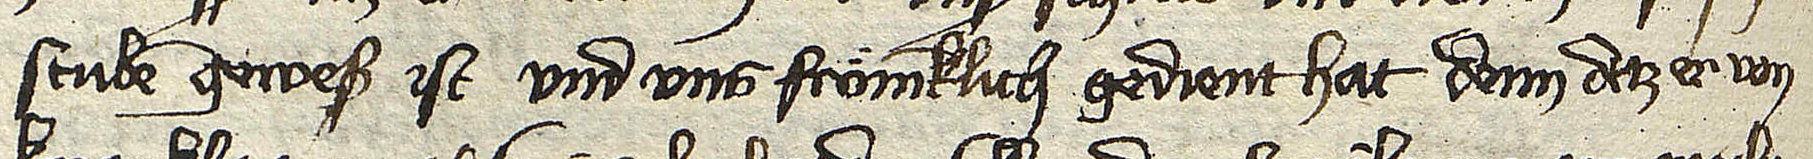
ſtube* geweſ* iſt vnd vns frömklich* gedient hat denn daʒ er von
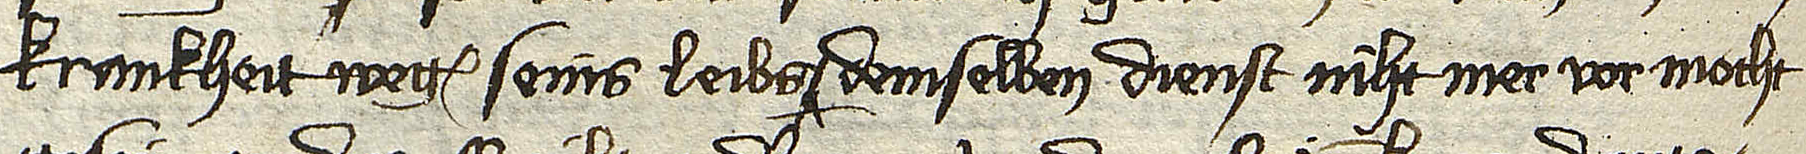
krankheit weg* ſeins leibs / demſelben dienſt niht mer vor mocht
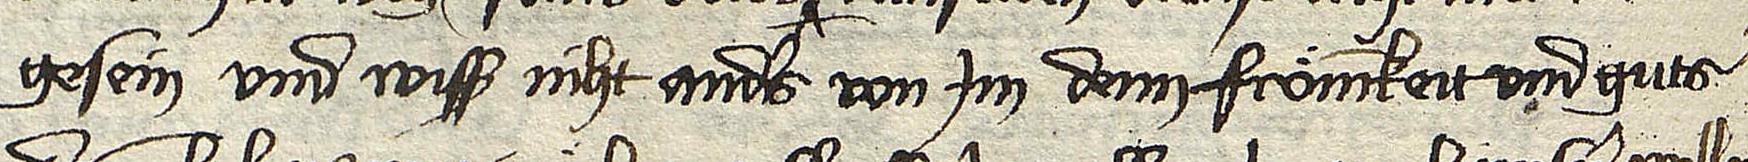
geſein vnd wiſſ* niht and*s von Im denn fröm*keit vnd guts
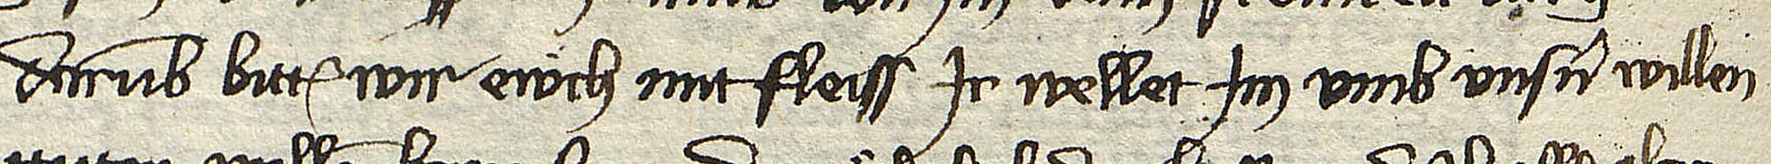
darub* bitt* wir ewch mit fleiſſ Ir wellet Im vmb vnſ*n willen
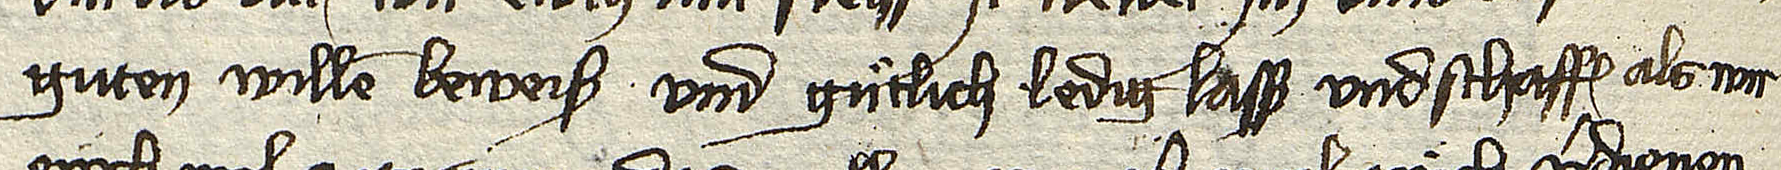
guten wille* beweiſ* . vnd gütlich ledig laſſ* vnd ſchaff* als wir
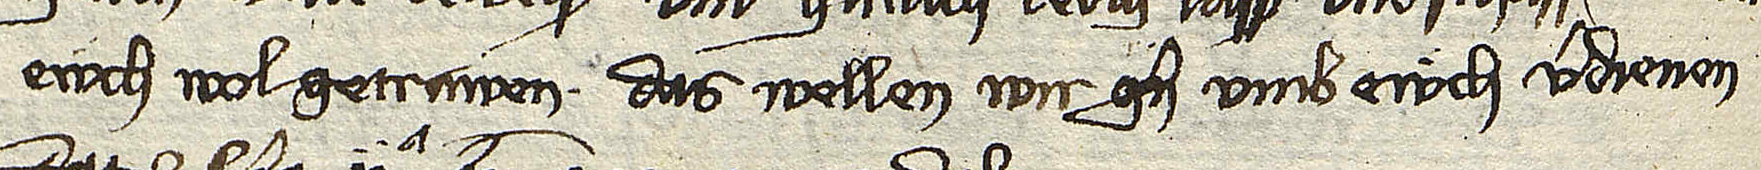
ewch wol getrawen . das wellen wir gn* vmb ewch v*dienen
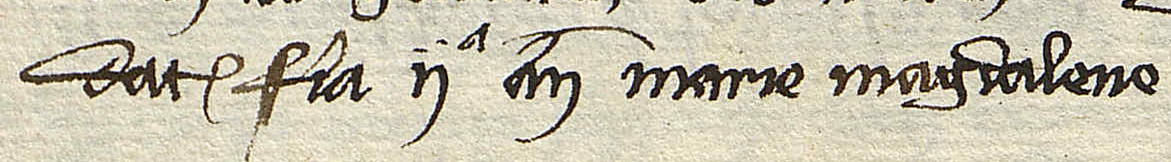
Dat* fia* ii* an* marie magdalene
